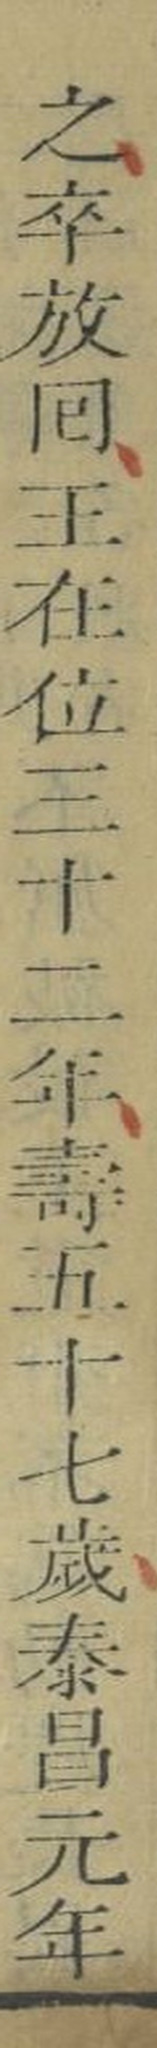之卒放回王在位三十二年寿五十七歳泰昌元年
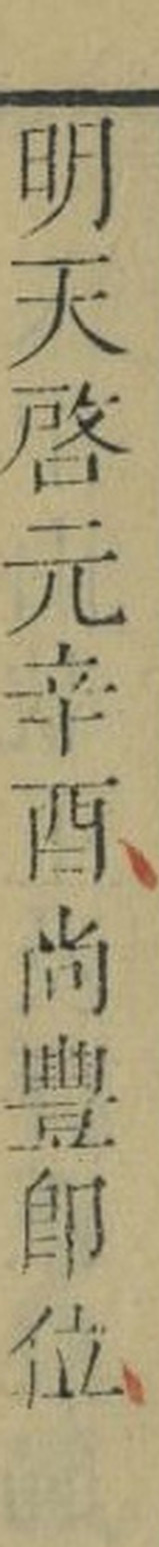明天啓元辛酉尚豊即位
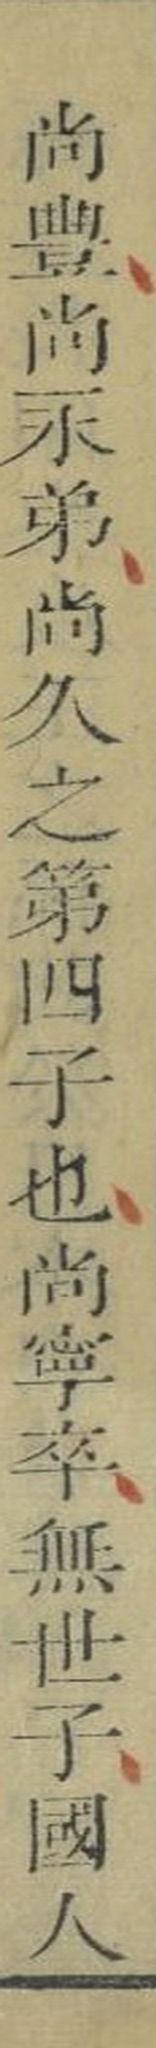尚豊尚永弟尚久之第四子也尚寧卒無世子国人
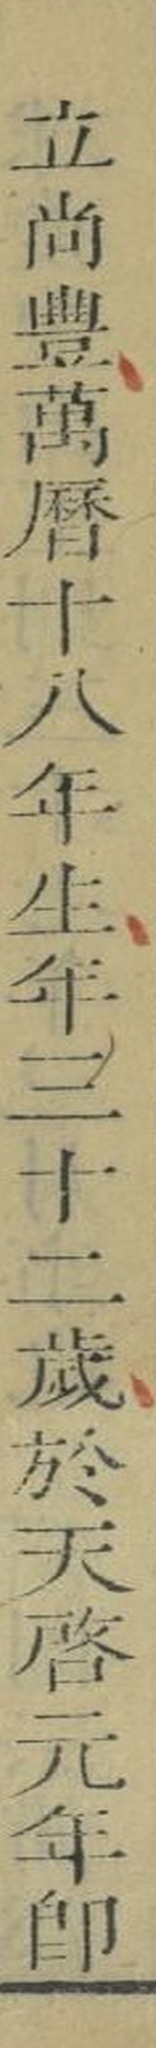立尚豊万暦十八年生年三十二歳於天啓元年即
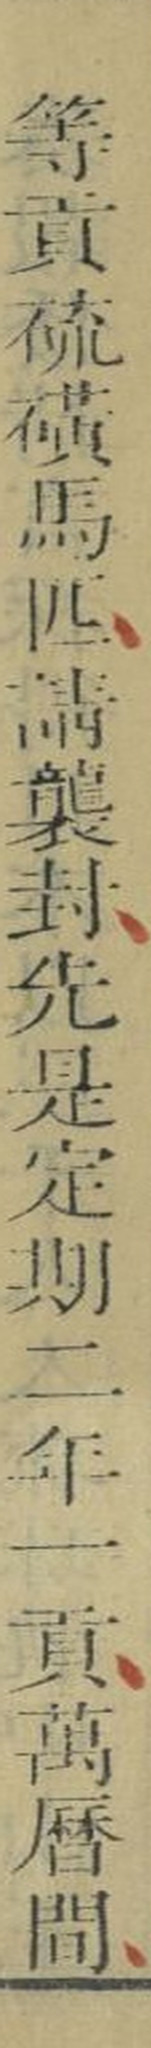等貢硫磺馬匹請襲封先是定期二年一貢万暦間
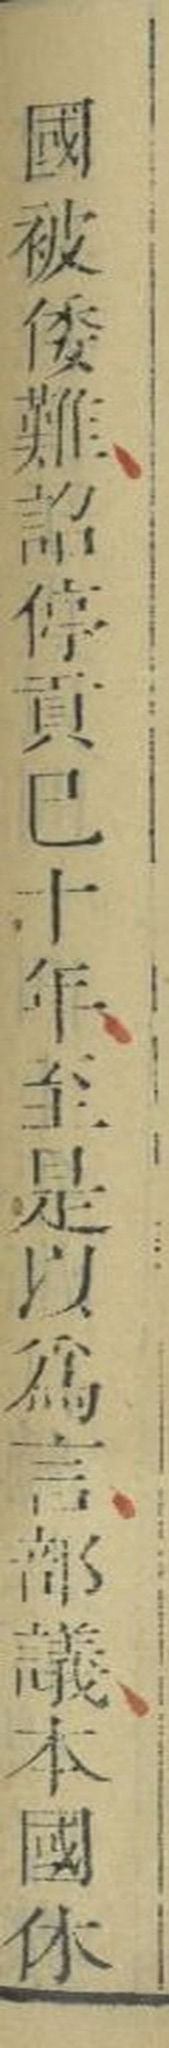国被倭難詔停貢巳十年至是以為言部議本国休
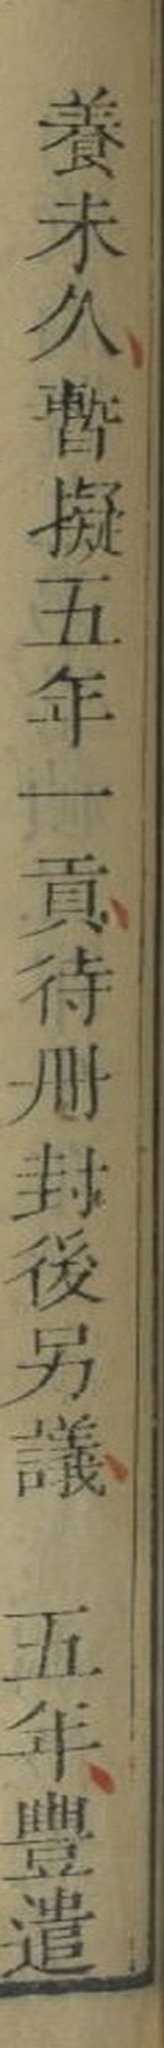養未久暫擬五年一貢待冊封後另議五年豊遣
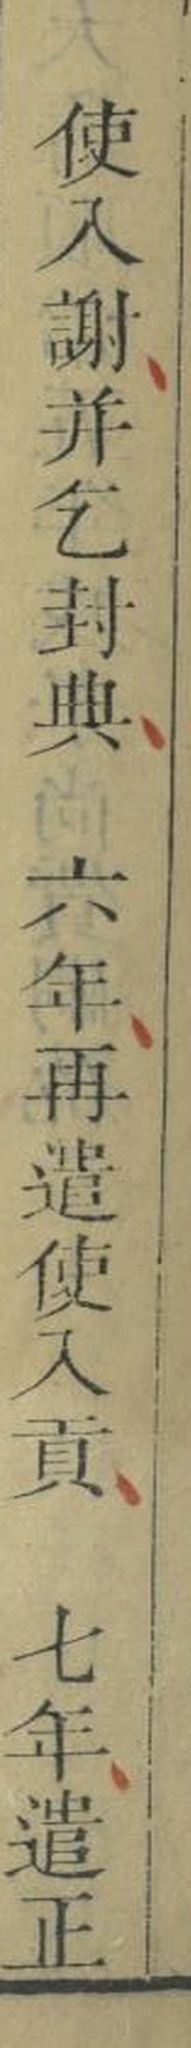使入謝并乞封典六年再遣使入貢七年遣正
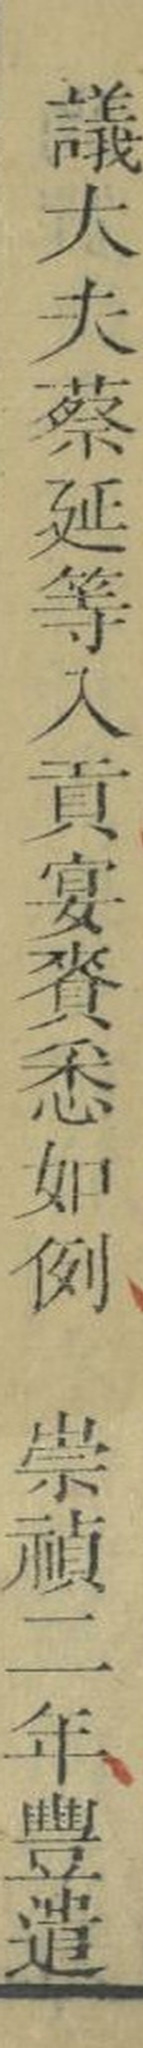議大夫蔡延等入貢宴賚悉如例崇禎二年豊遣
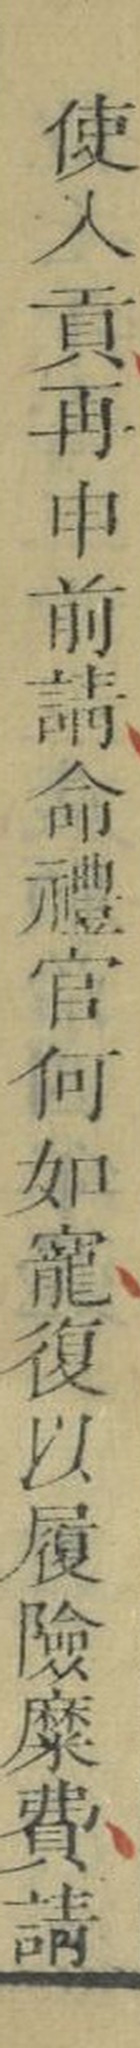使入貢再申前請命礼官何如寵復以履険糜費請
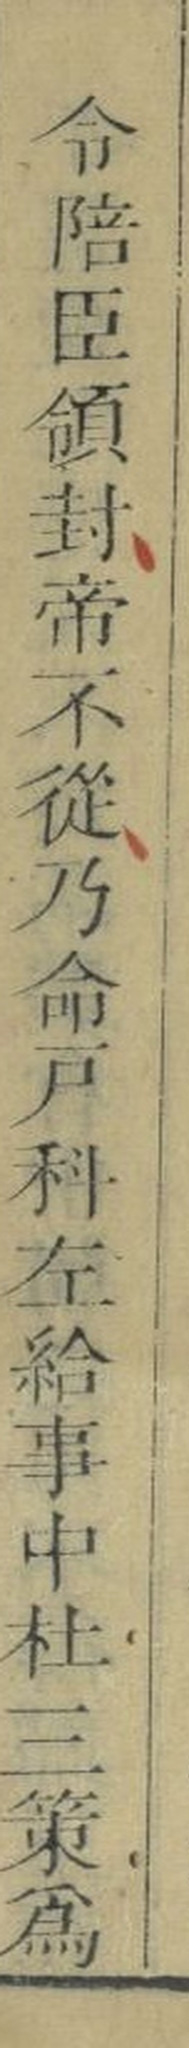令陪臣領封帝不従乃命戸科左給事中杜三策為
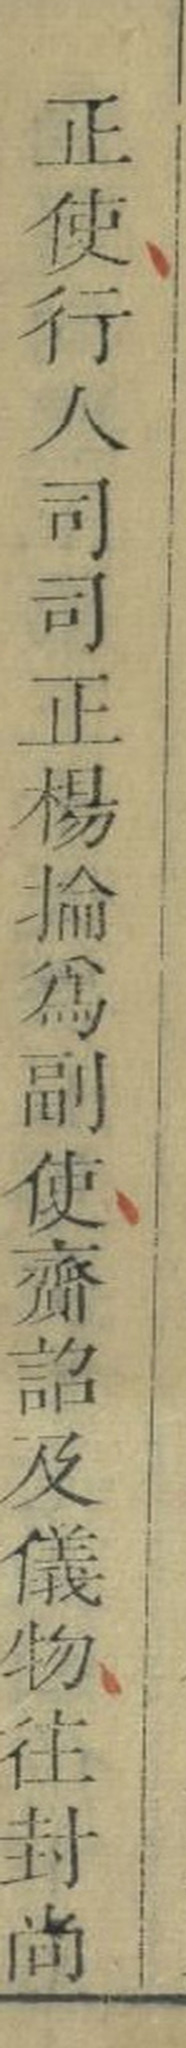正使行人司司正楊掄為副使齎詔及儀物往封尚
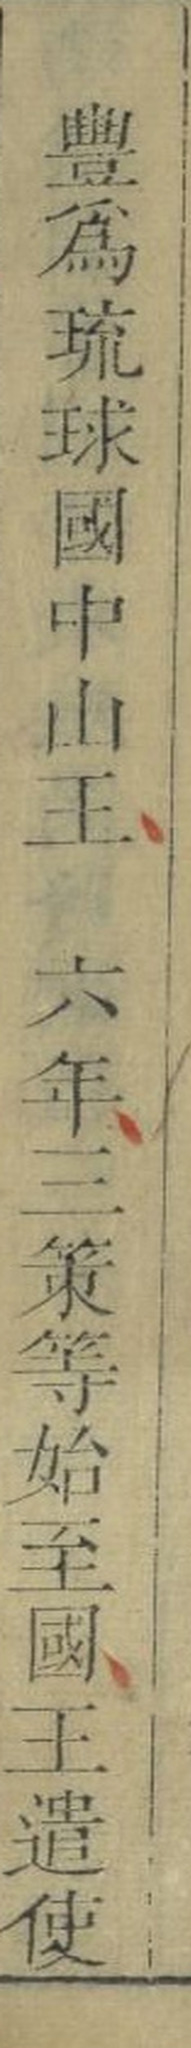豊為琉球国中山王六年三策等始至国王遣使
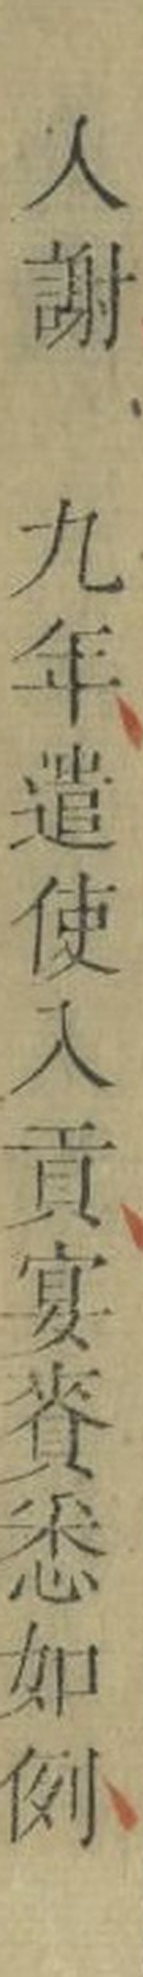入謝九年遣使入貢宴賚悉如例
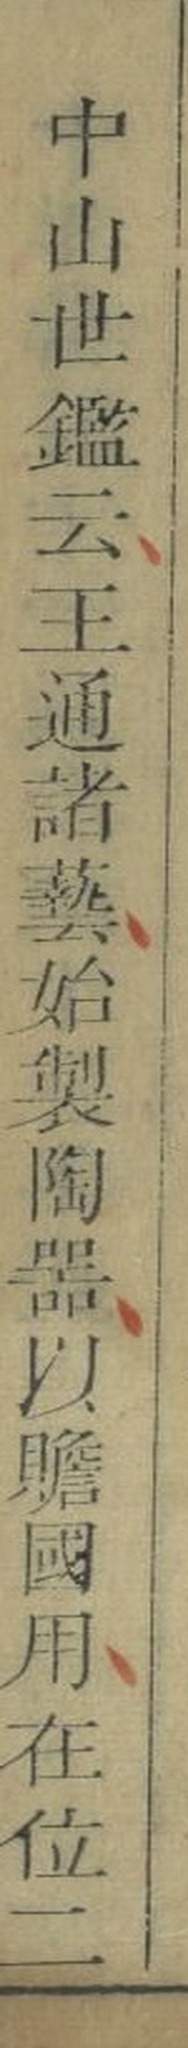中山世鑑云王通諸芸始製陶器以贍国用在位二

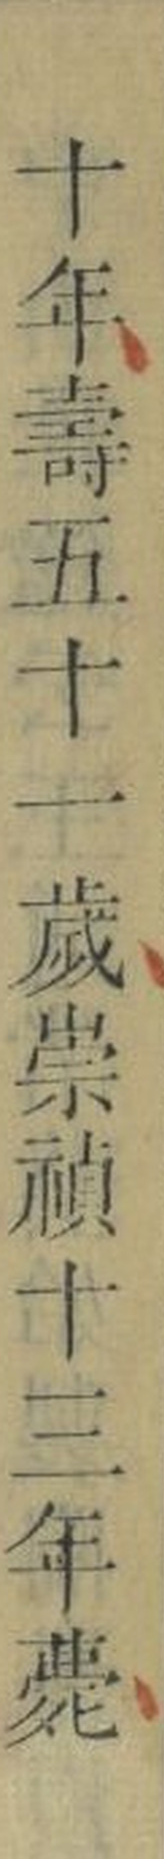十年寿五十一歳崇禎十三年薨
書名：中山伝信録 巻三
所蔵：University of the Ryukyus Library
